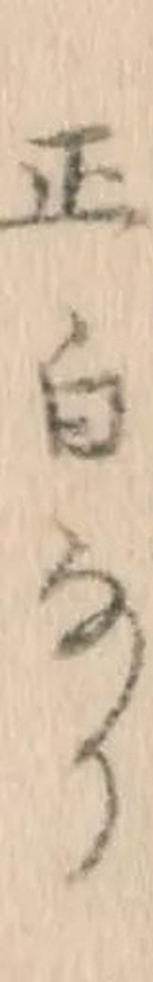正白なり

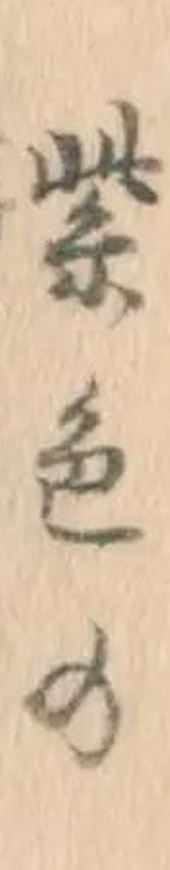紫色の
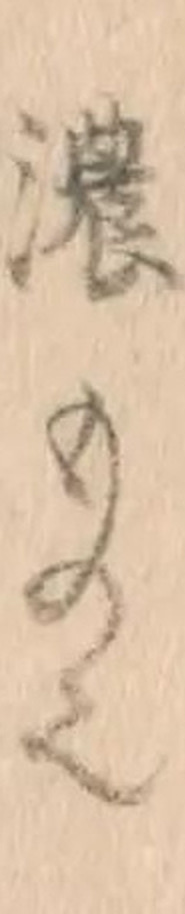濃もの也
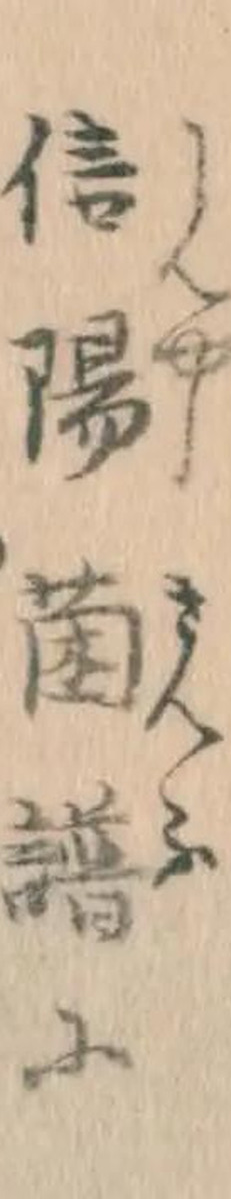信陽菌譜に
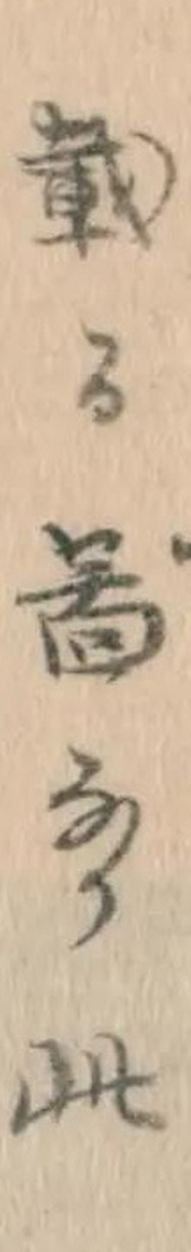載る図なり此
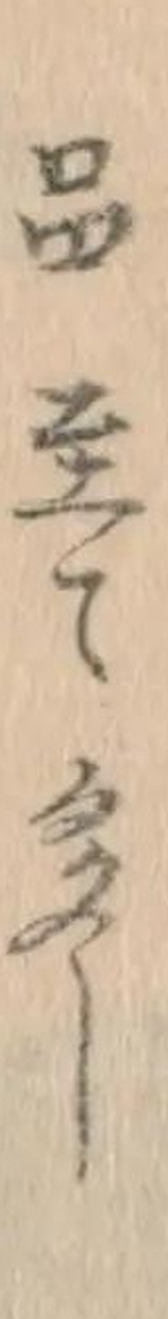品至て多し

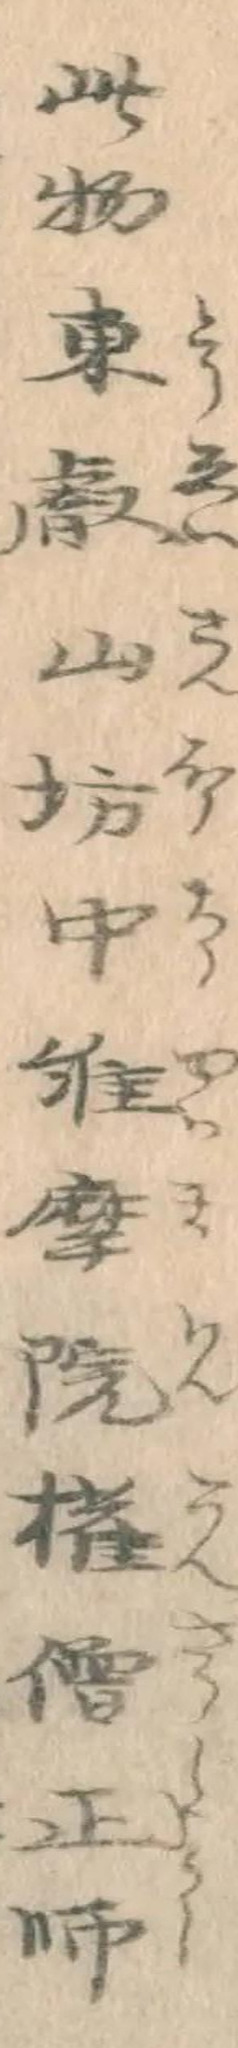此物東叡山坊中維摩院権僧正師
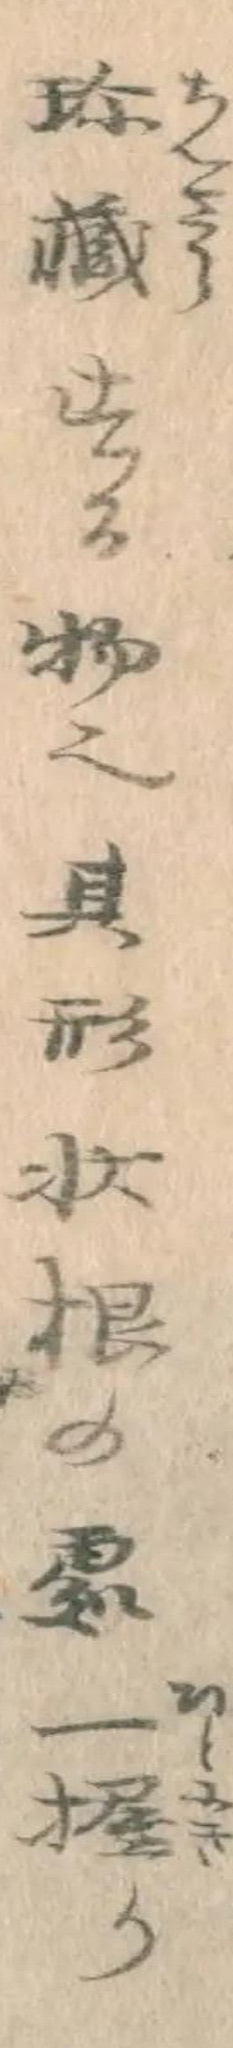珍蔵する物也其形状根の処一握り
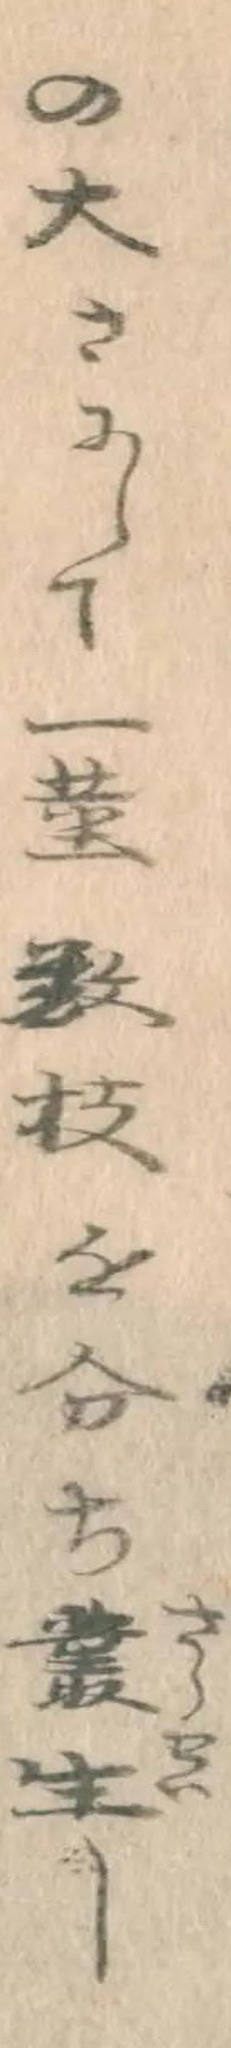の大さにして一茎数枝を分ち叢生し
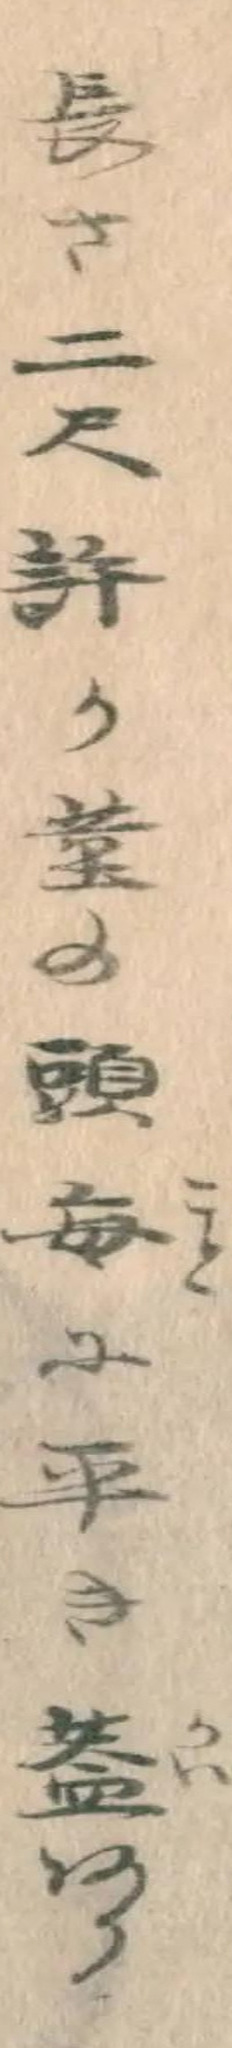長さ二尺許り茎の頭毎に平き蓋あり
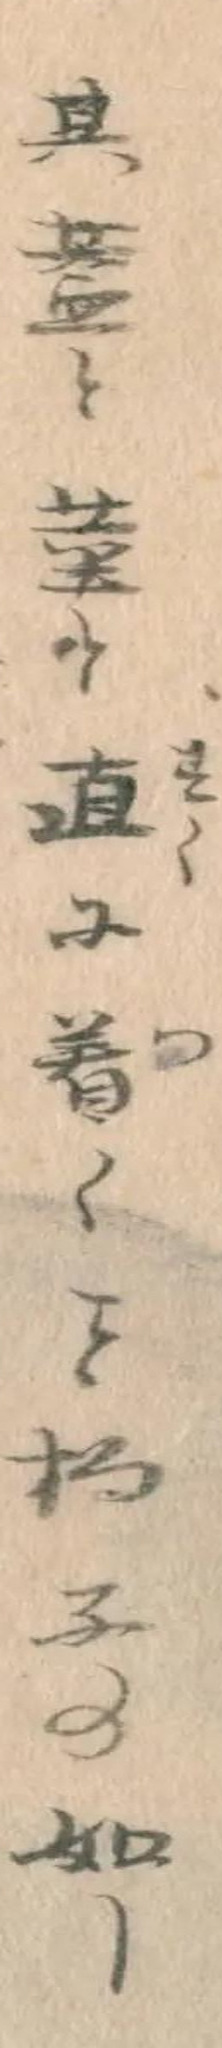其蓋と茎と直に着くこと杓子の如し
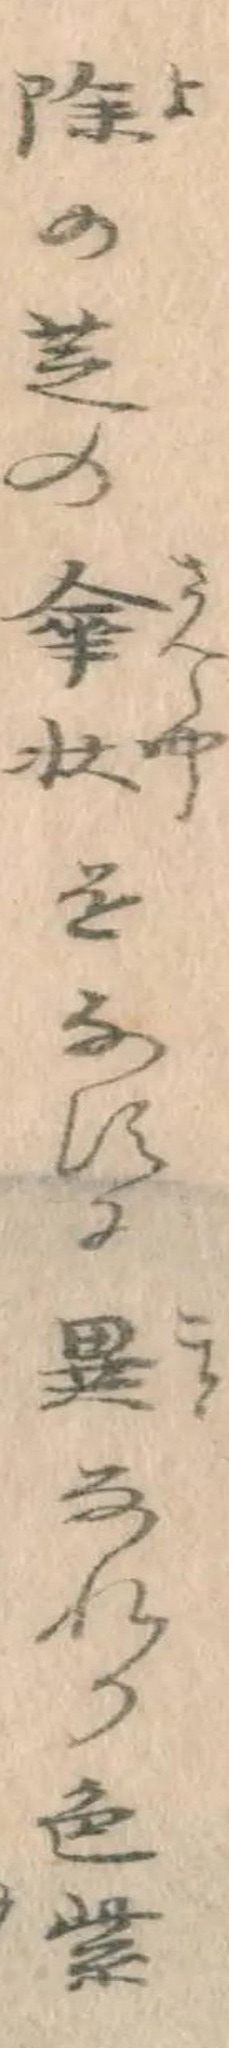除の芝の傘状をなすに異なれり色紫
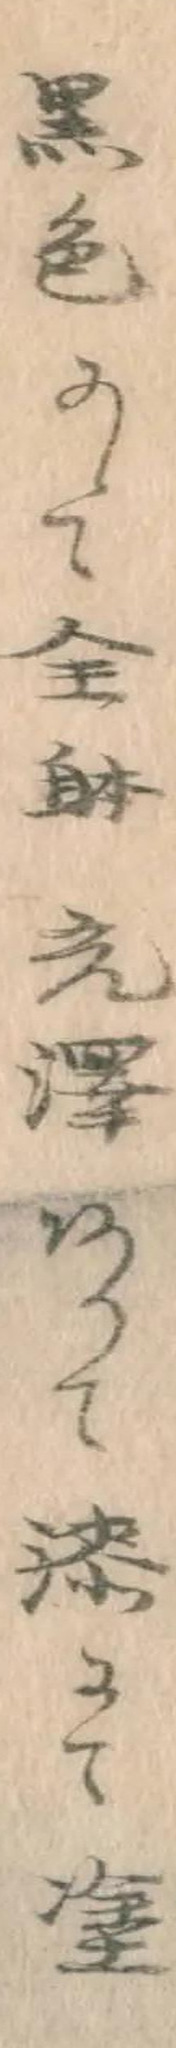黒色にして全体光沢ありて漆にて塗
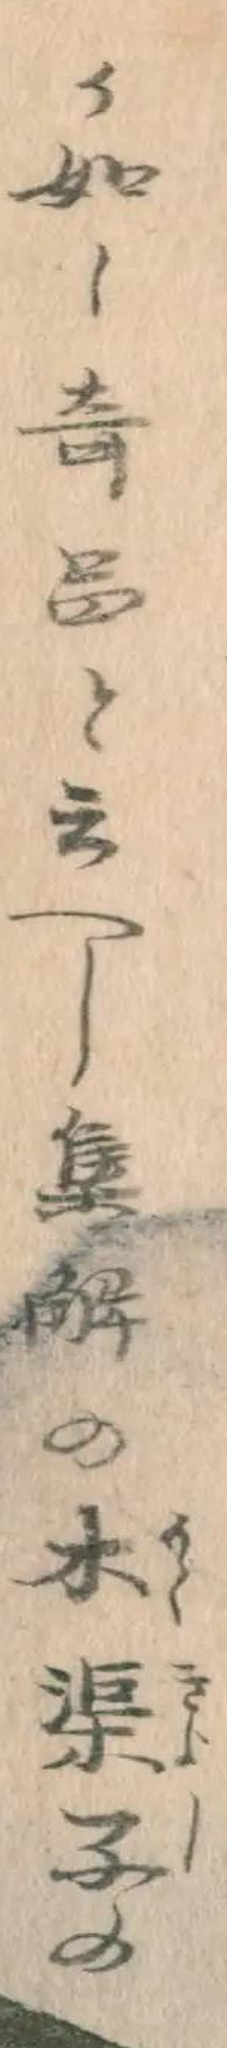か如し奇品と云へし集解の木渠子の
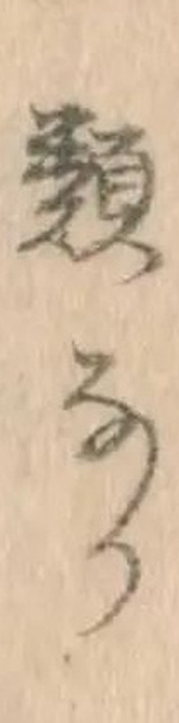類なり

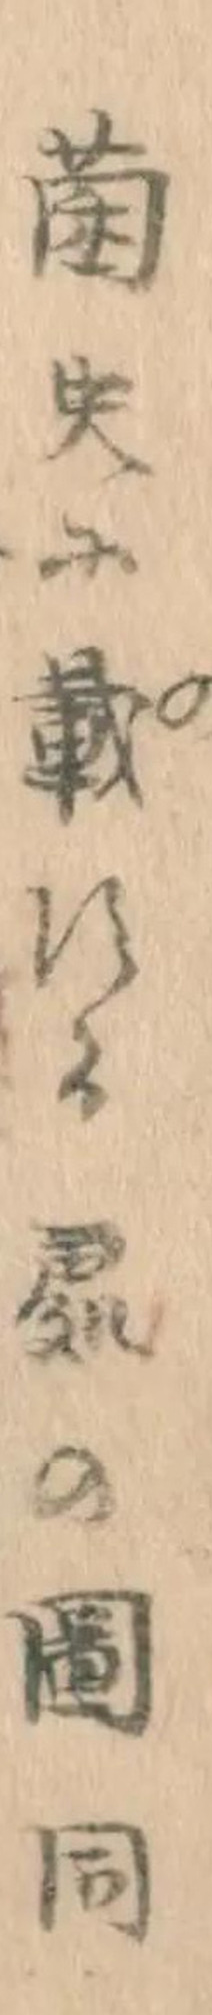菌史に載する処の図同
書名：本草図譜. 巻55-57
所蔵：国立国会図書館 National Diet Library, JAPAN
